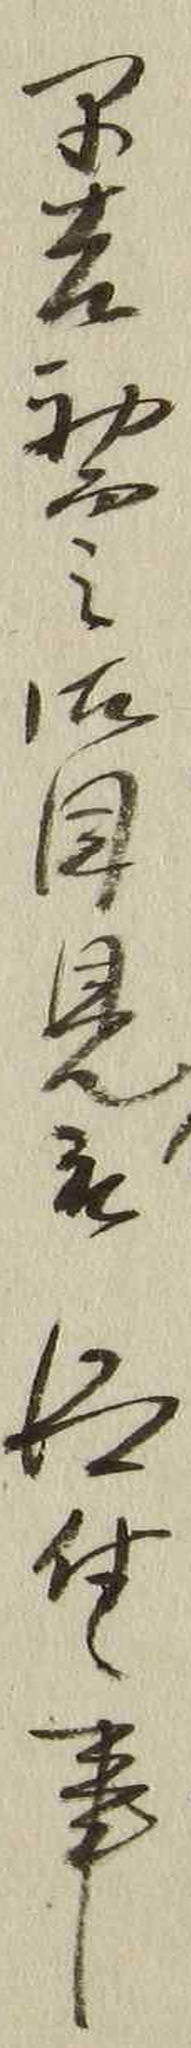早吉初而之御目見被仰付候事
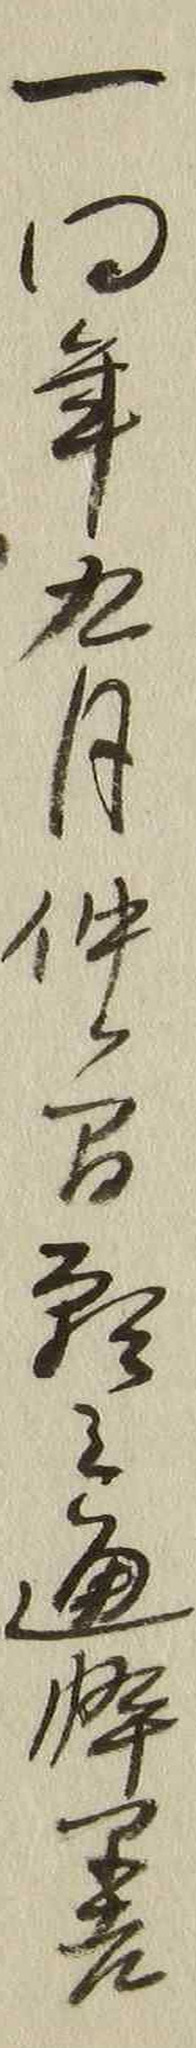一同年九月仲ケ間願之通忰早吉
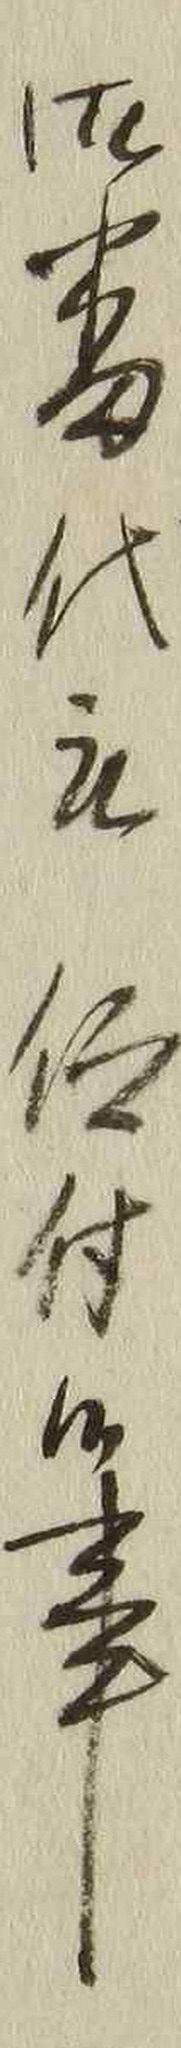御番代被仰付候事
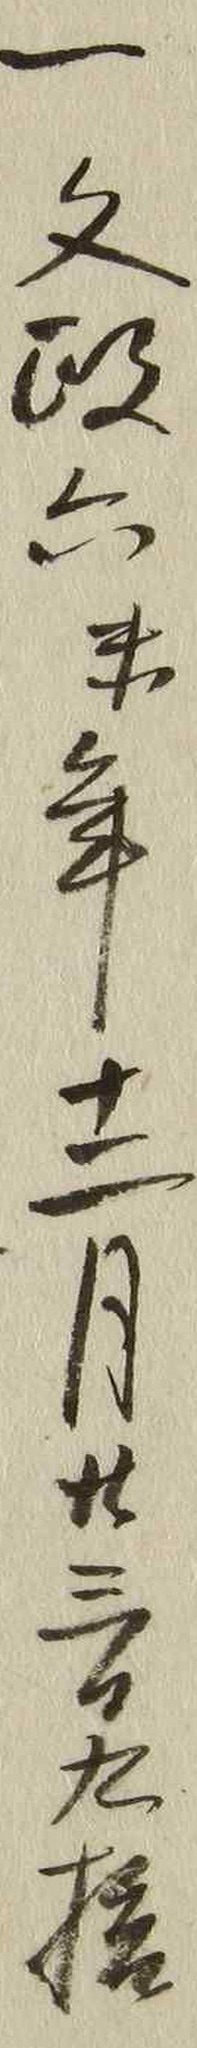一文政六未年十二月廿三日九拾
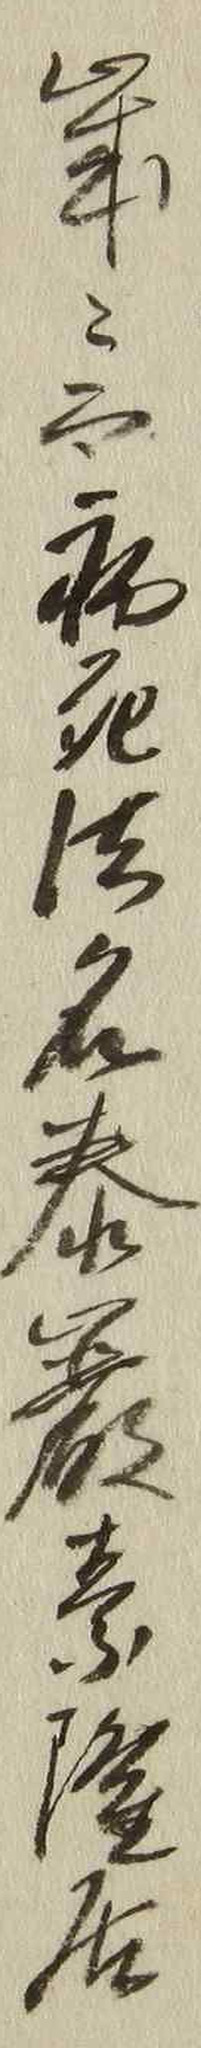歳ニ而病死法名泰巌素隆居
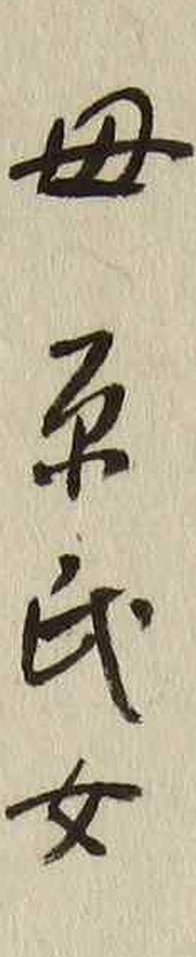母原氏女
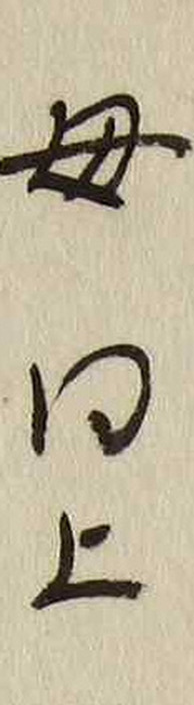母同上
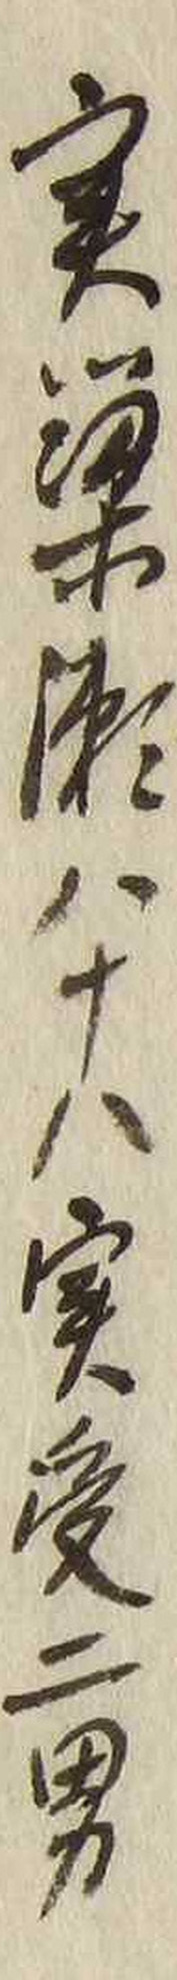実簗瀬八十八実受二男

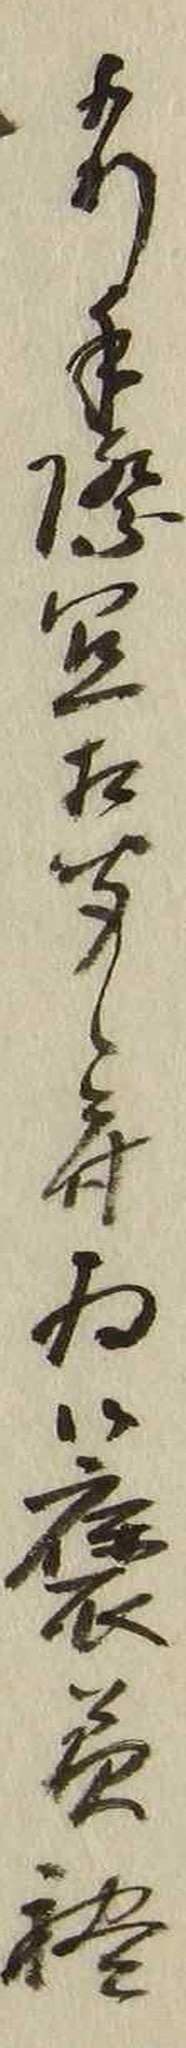より手際宜相聞候ニ付為御褒美礼
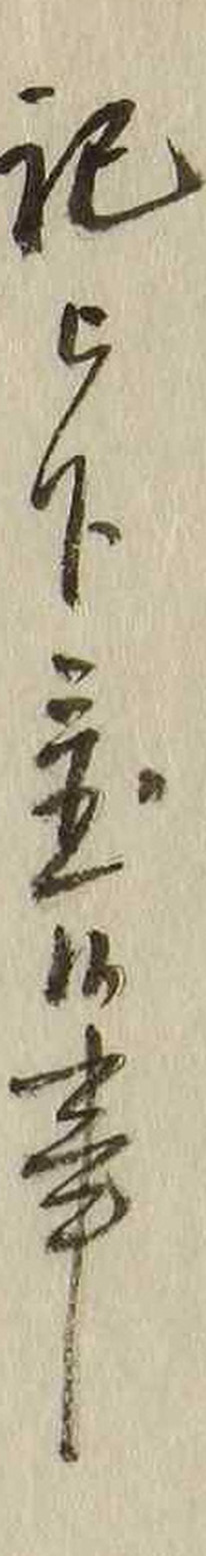記被下置候事
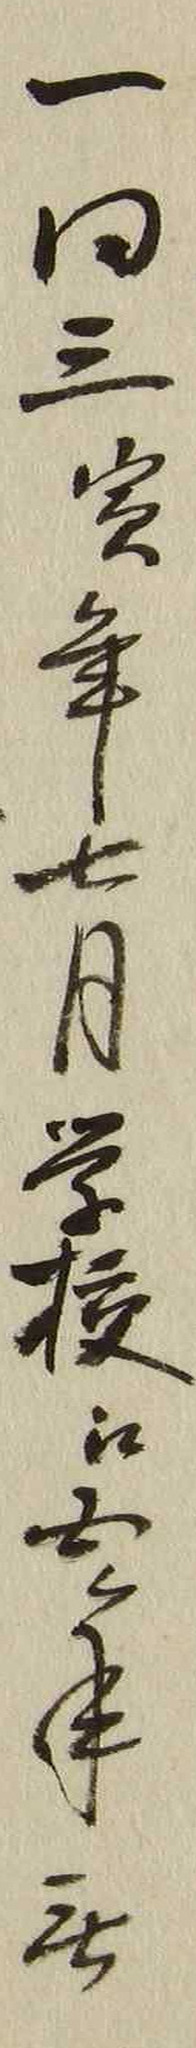一同三寅年七月学校江五ケ年無
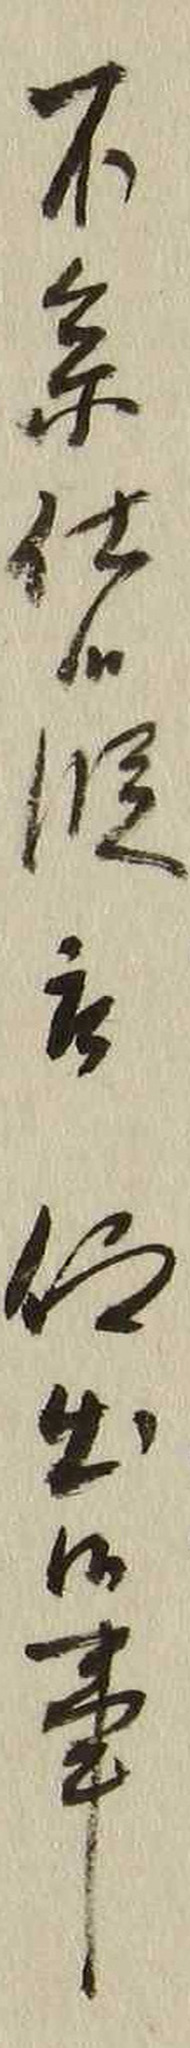不参仕候段被仰出候事
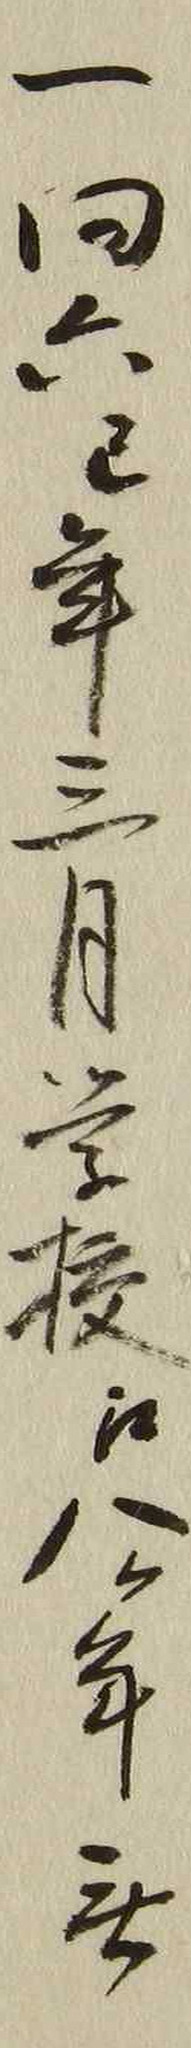一同六巳年三月学校江八ケ年無
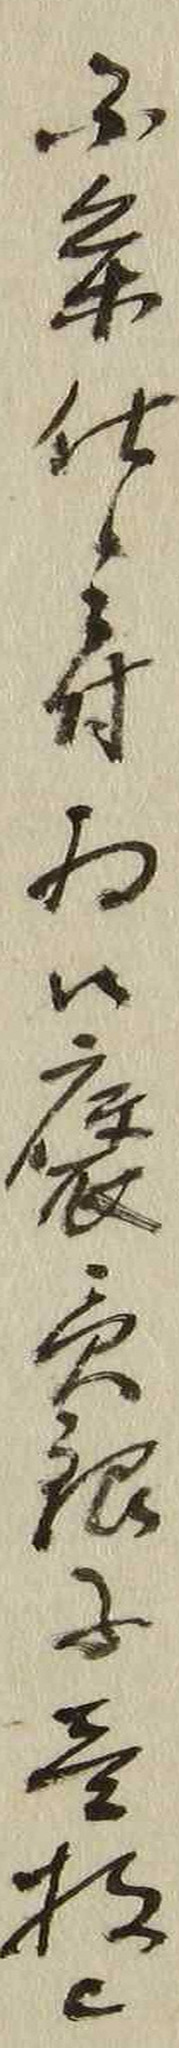不参仕候ニ付為御褒美銀子壱枚被
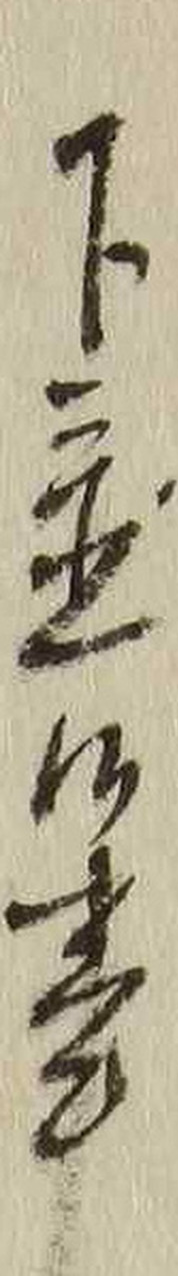下置候事
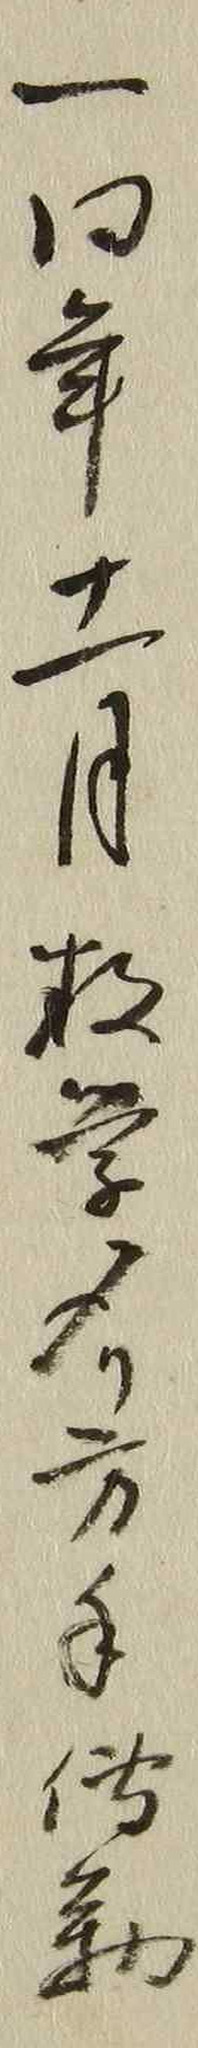一同年十一月数学〆り方手伝勤
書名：諸士系譜　巻之359　す之部9
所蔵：会津若松市立会津図書館
